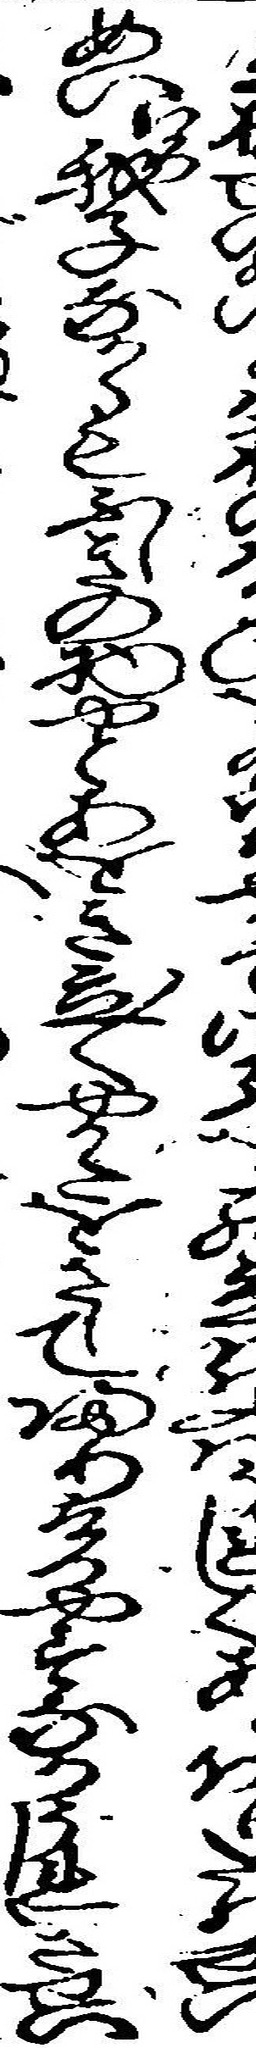めいいろ我子なからもふしきの物やとあをき立〳〵やかたをさして帰りけるやすなかうれしさせい
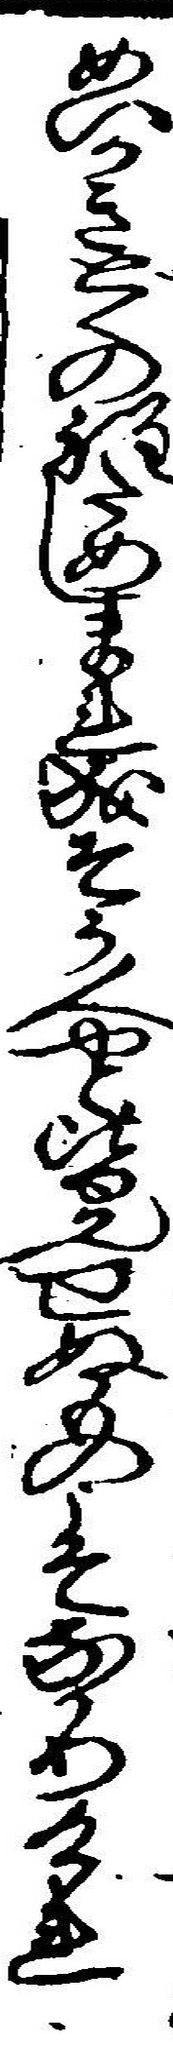めいかきどくの程ためしまれ成そう人やと皆かんせぬものこそなかりけれ
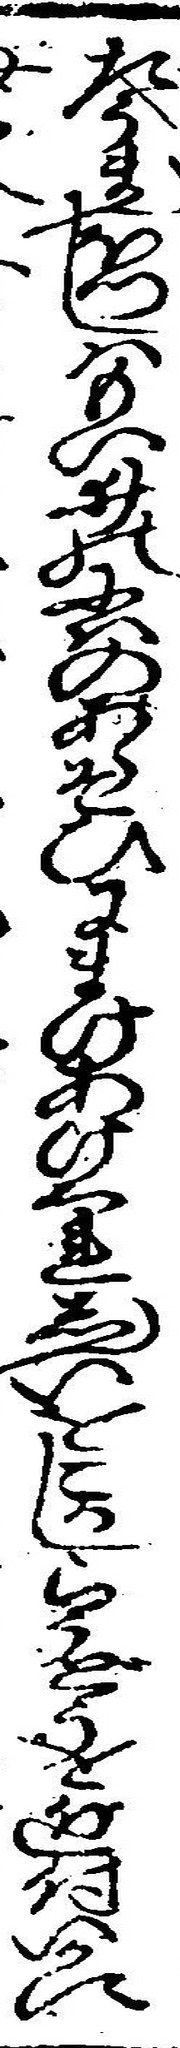だうまんほつしはもい井のにはのあらそひにまけあけくれしんいをこかしらうどうを近付いかに
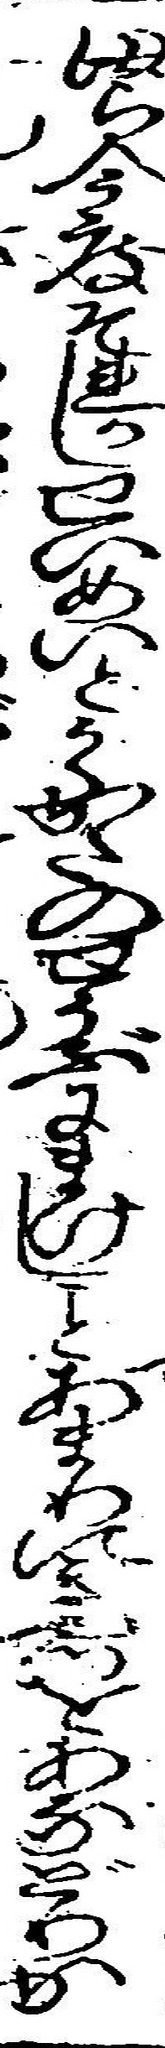汝ら今度それかしせいめいとうらかたのせうぶにまけしことあまりにきつをあなどりか
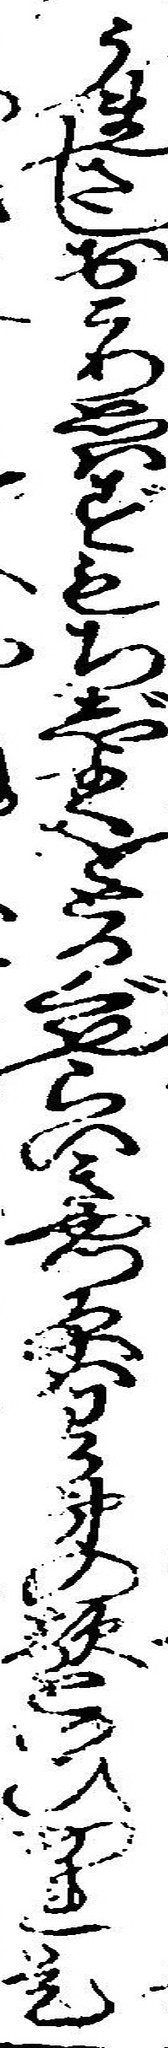うまんさしおこり思はずもちじよくをとるぐわんらいきやつ原はわか弟の敵といひかれ是
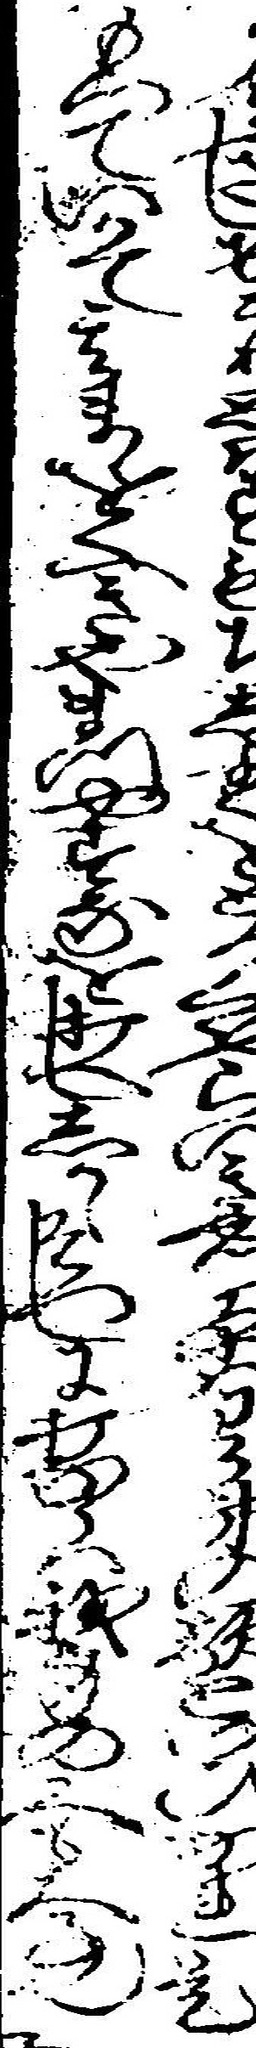もつていかて其まゝをくへきやまつやすなを打へししかしそつしに打からは我身のうへも大事也
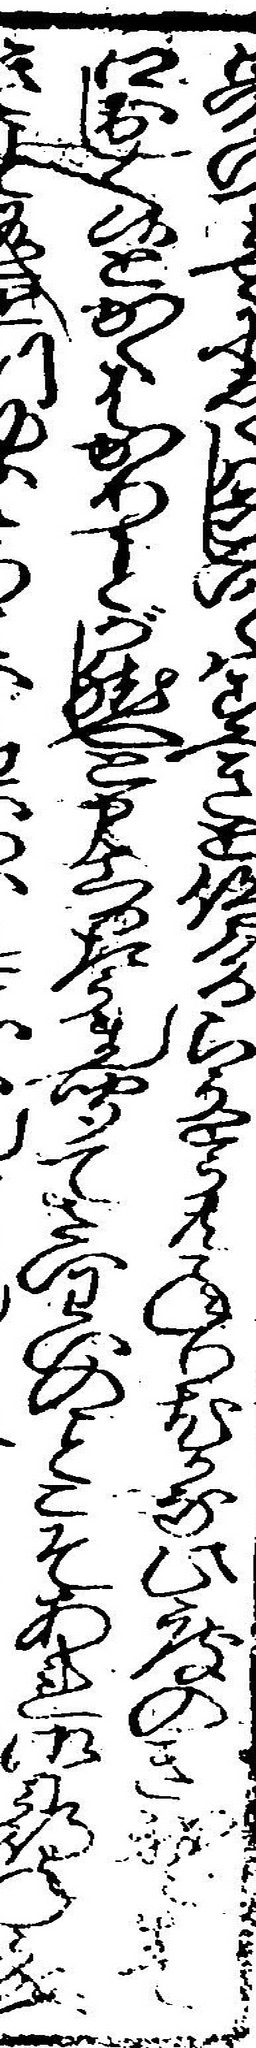口おしく候とかくはかりことが然へしと申上るたうまん聞きてさいわいのことこそあれ御尋ね被成へ
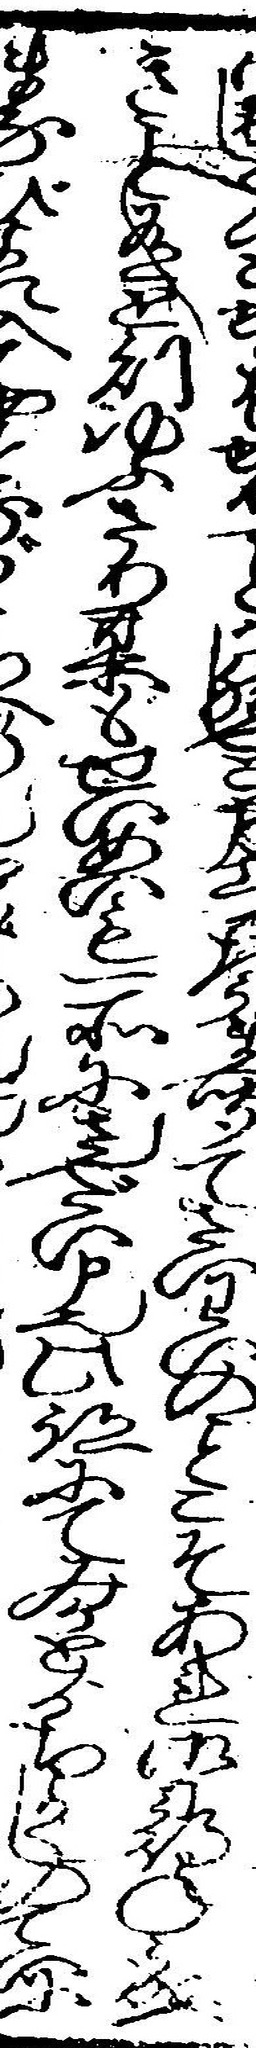きこと有と則ゆふさり某もせいめいも一所にさんだい申也此跡にてみかとゟちよくしのていに
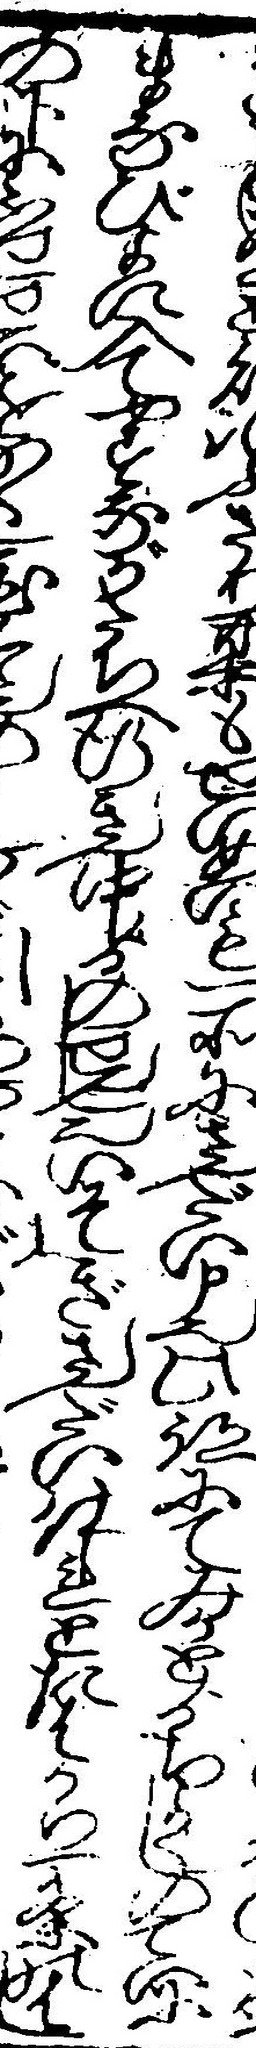まなびよに入てやすながたちへ行きん中ゟのせんし也いそぎさんだい仕れとたはかり一条のはし
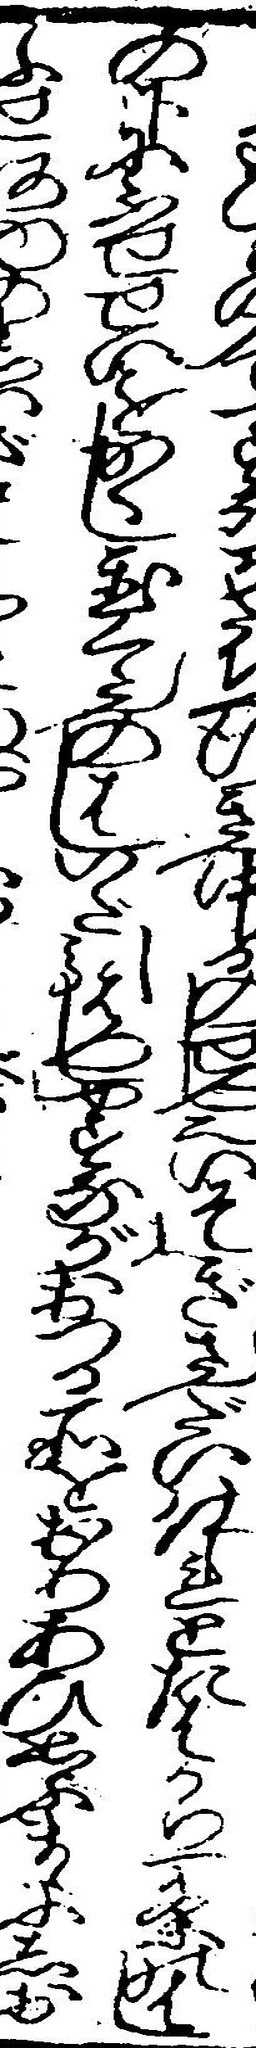の下にふせせいをかくし置くたんのはしいた引はつしやすながおつる所をおりあひ思ふまゝにしお
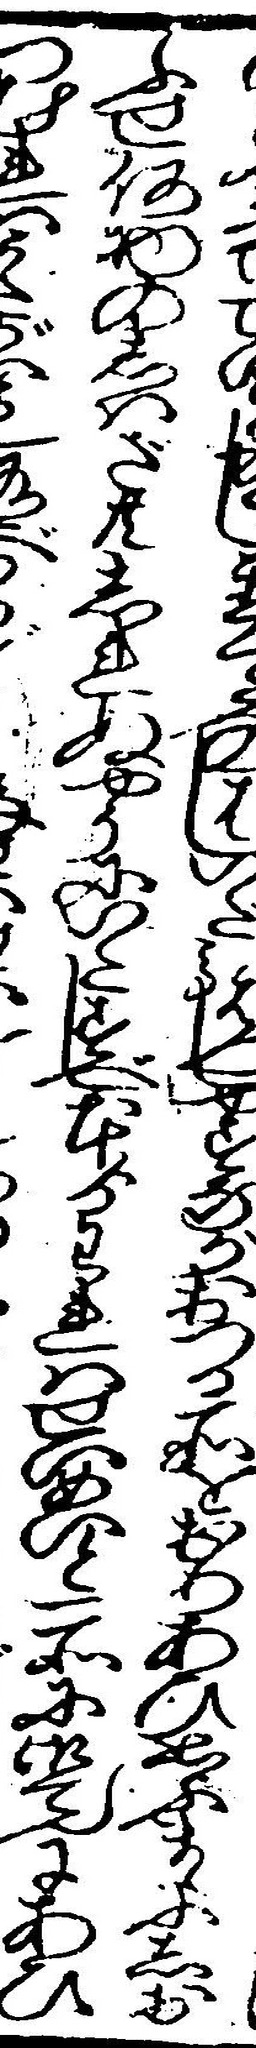ふせ何物のしはざ共しれぬやうにいたすべし本ゟわれはせいめいと一所に御てんにあひ
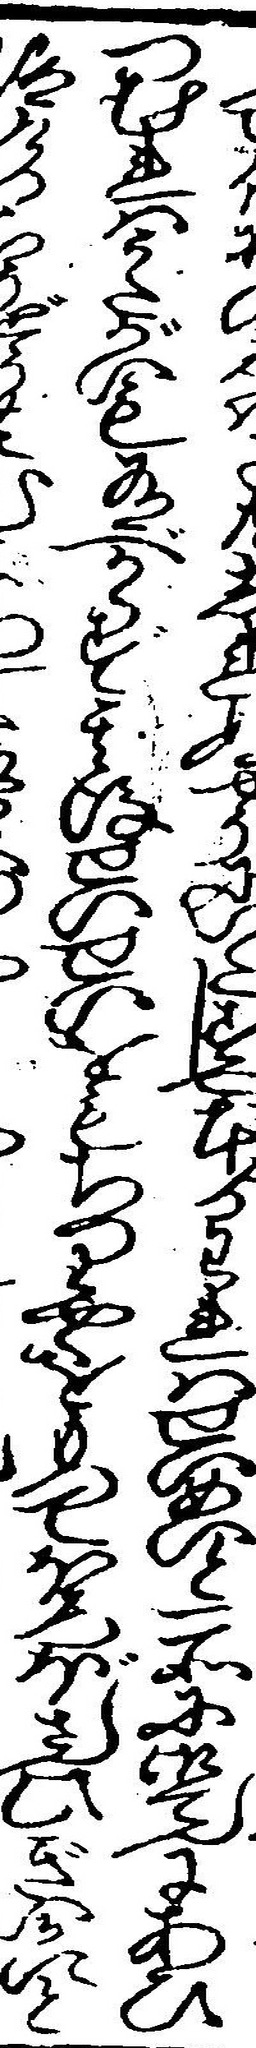つむれはうたがいも有るべからず其後せいせいをもちりやくをもつてほろぼさん此ぎいかにと
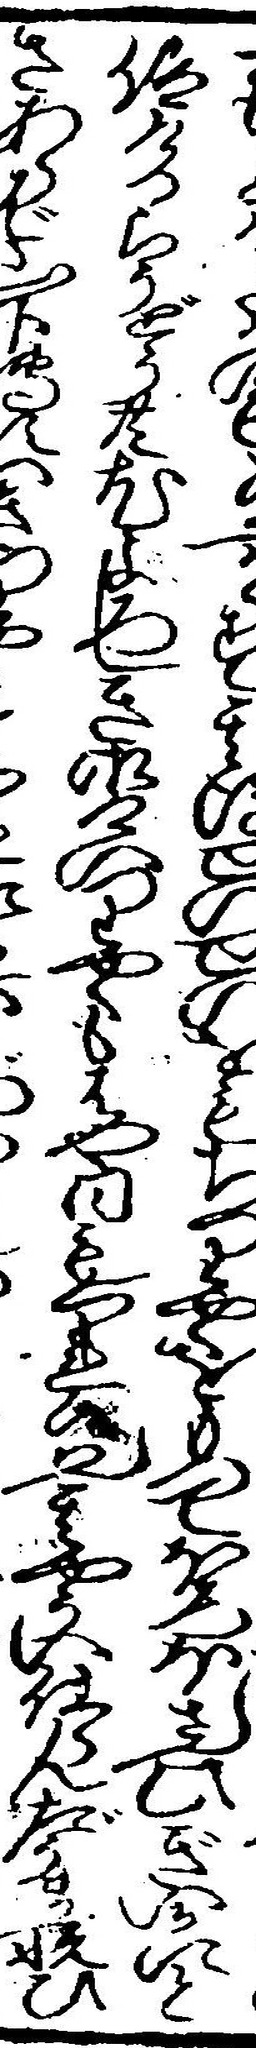仰けるらうどう共尤よろしき御けいりやくもはや日もくれ候はん其やうい仕らんだうまん悦ひ
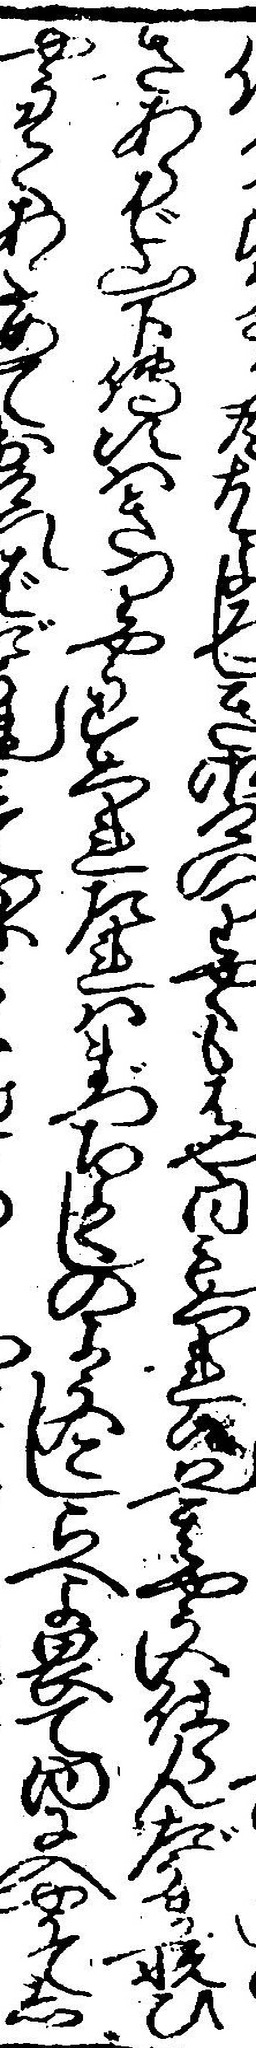さあらば山下伝次はきりやうすくれたれはまづちよくしのよういこしらへよ畏て内に入やかてし
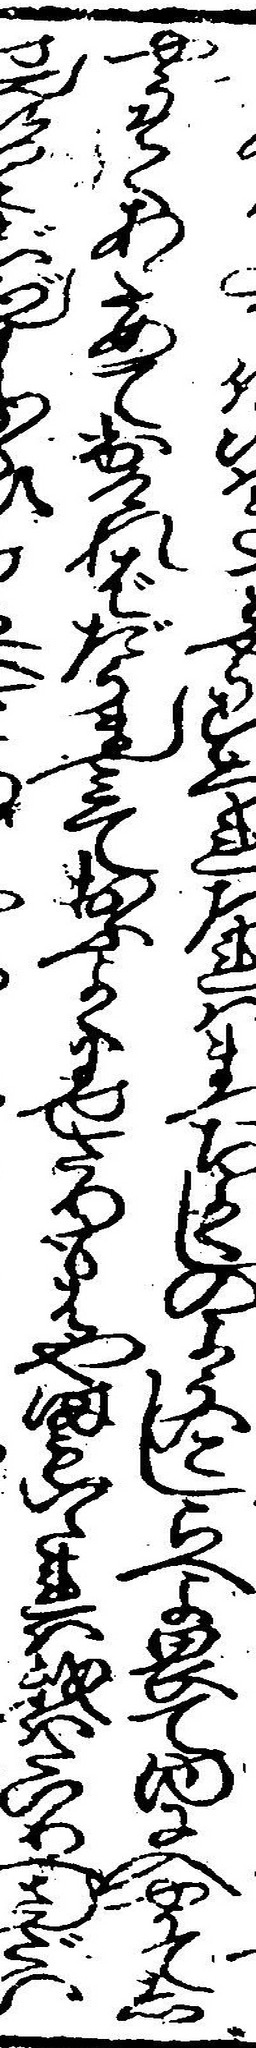しやうそくあらためて出ければだうまんみておふよくにせたりもはや時もいたれは我はたいりへさんだい
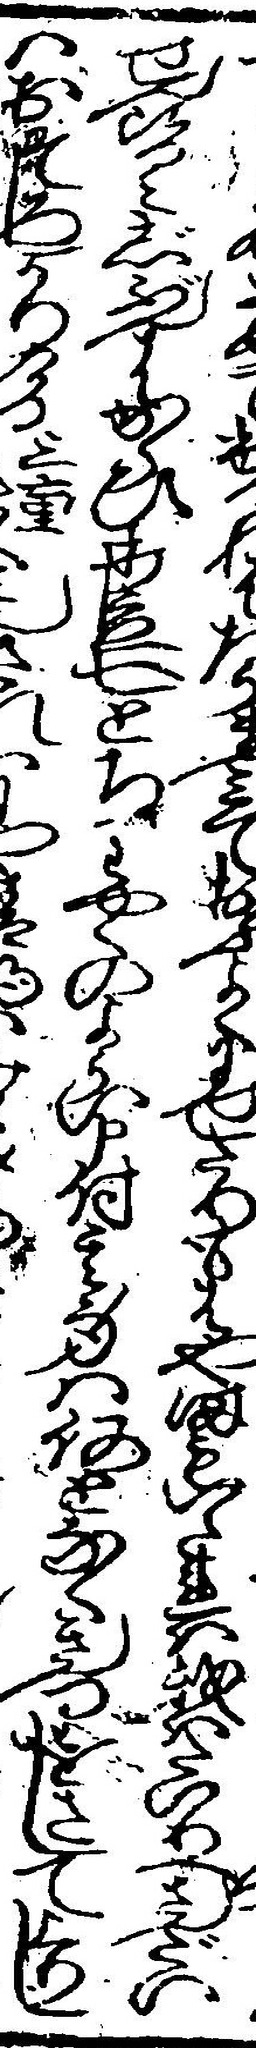せん皆々じぶんはからひ打立へしとちりやくのようい申付其身は何となくきんりをさして上りし
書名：[しのだづまつりぎつね付あべの清明出生]
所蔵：東京大学総合図書館 General Library in the University of Tokyo, JAPAN
